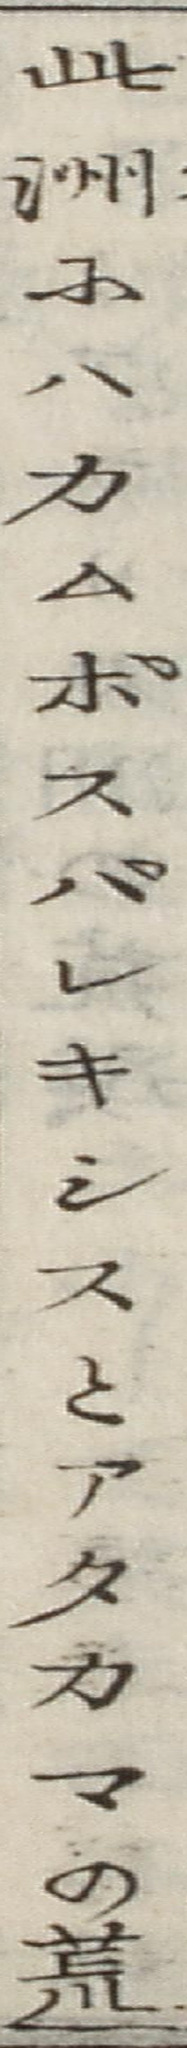此洲にはカムポスパレキシスとアタカマの荒
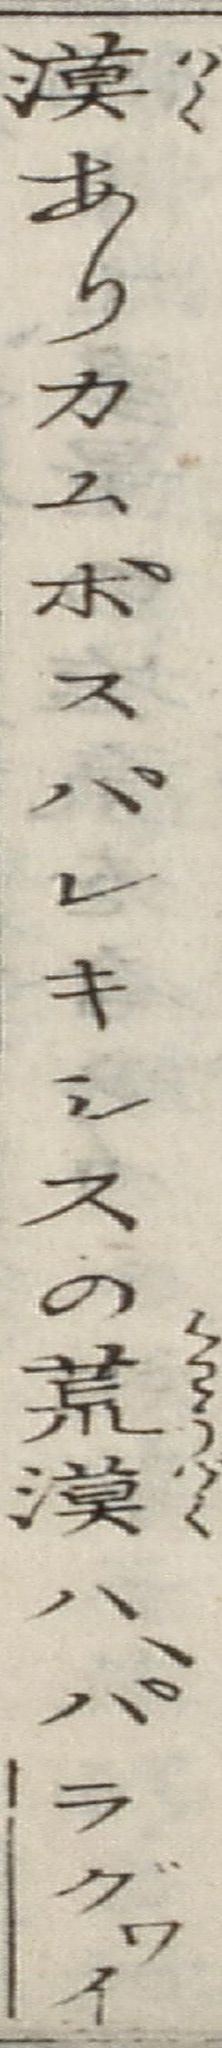漠ありカムポスパレキシスの荒漠は、パラグワイ
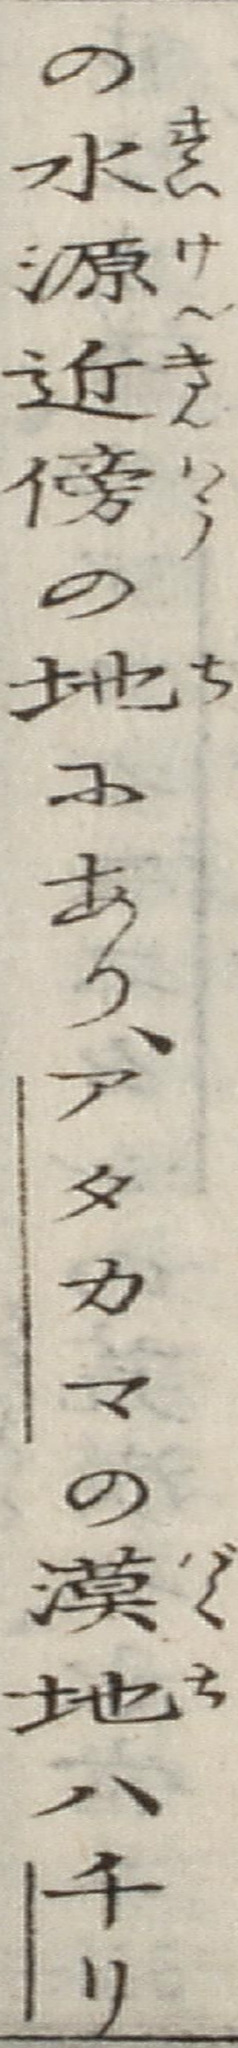の水源近傍の地にあり、アタカマの漠地はチリ
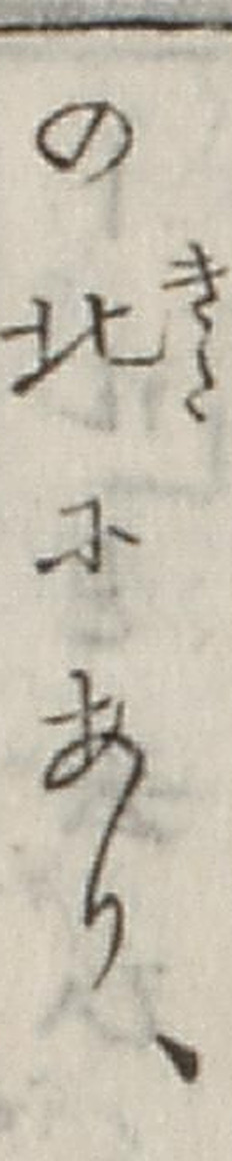の北にあり、
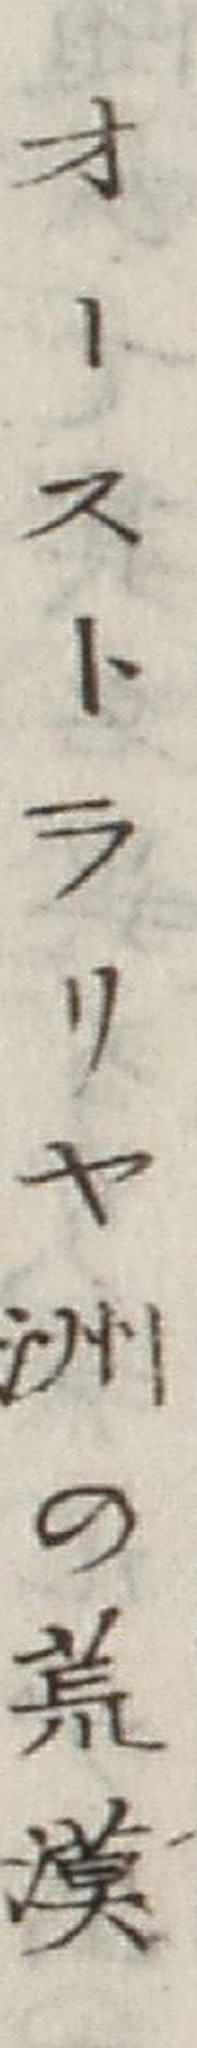オーストラリヤ洲の荒漠
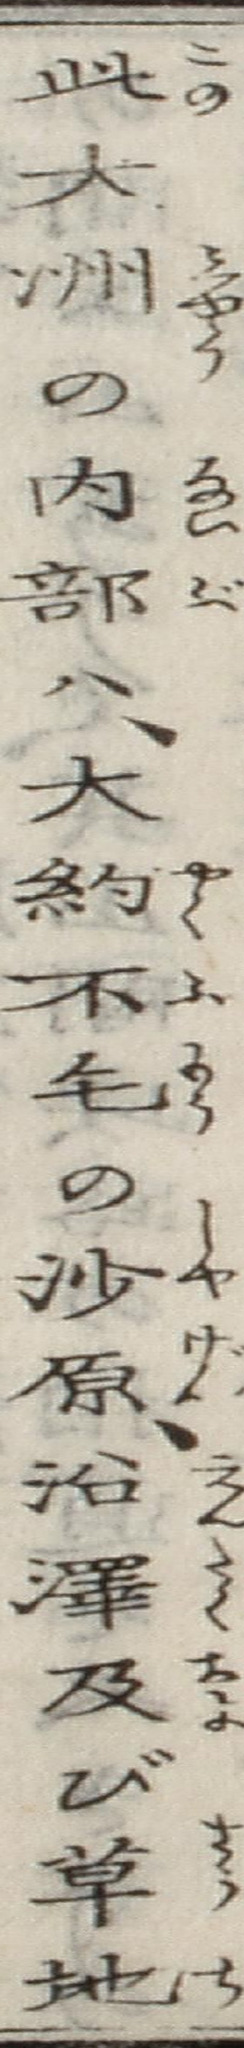此大洲の内部は、大約不毛の沙原、沿澤及び草地
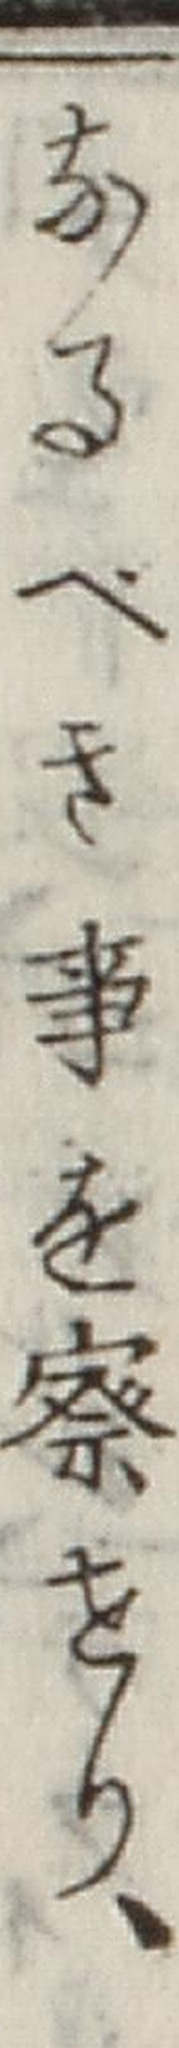なるべき事を察せり、
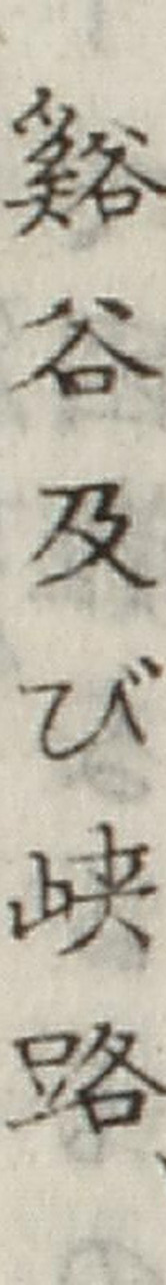谿谷及び峡路、
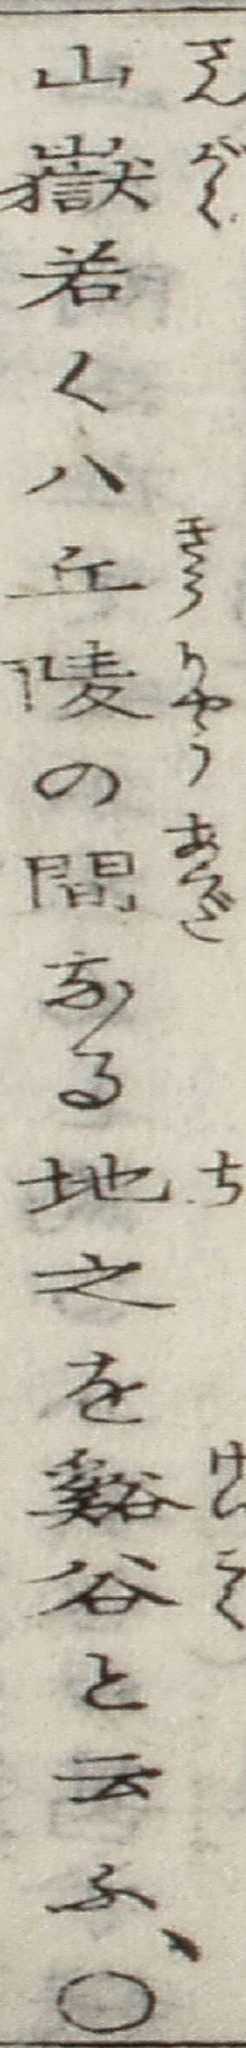山嶽若くは丘陵の間なる地之を谿谷と云ふ、〇
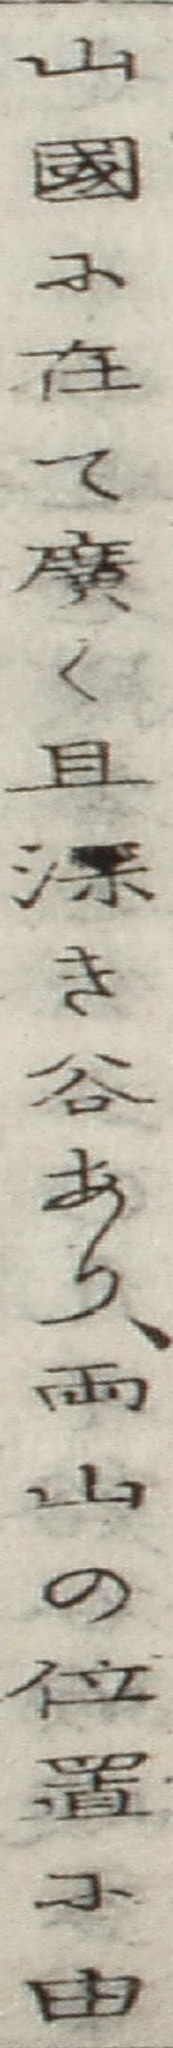山國に在て廣く且深き谷あり、両山の位置に由
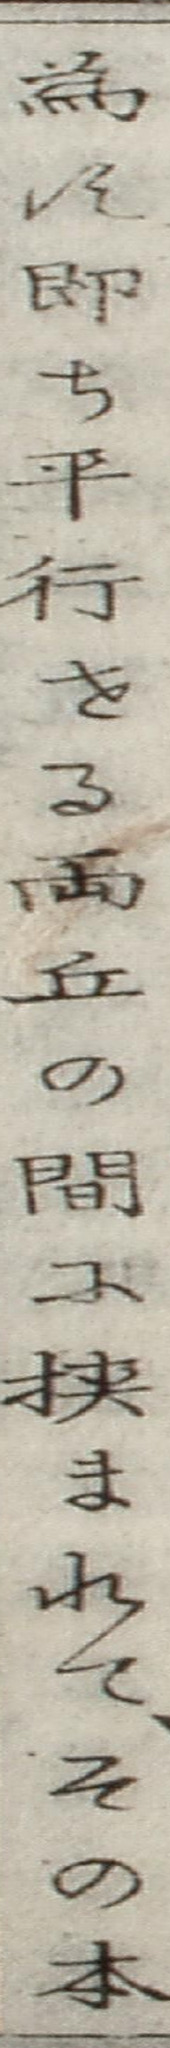為す、即ち平行せる両丘の間に挟まれて、その本

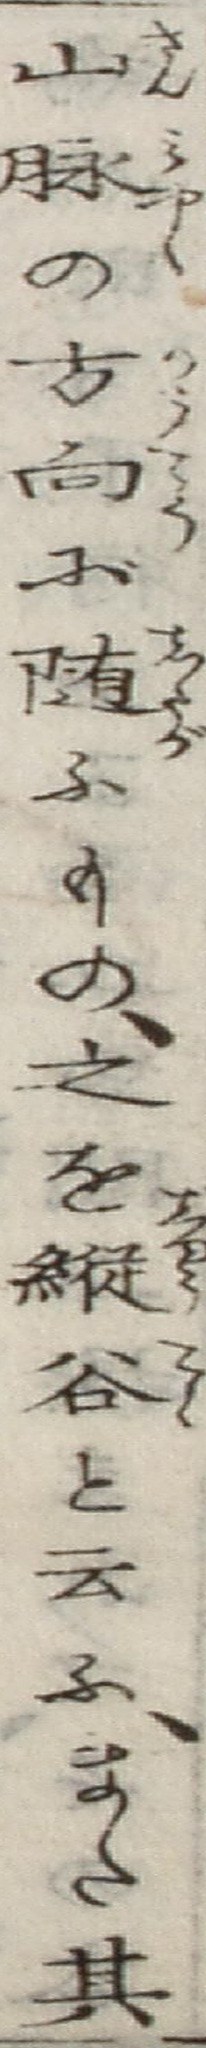山脈の方向に随ふもの、之を縦谷と云ふ、また其
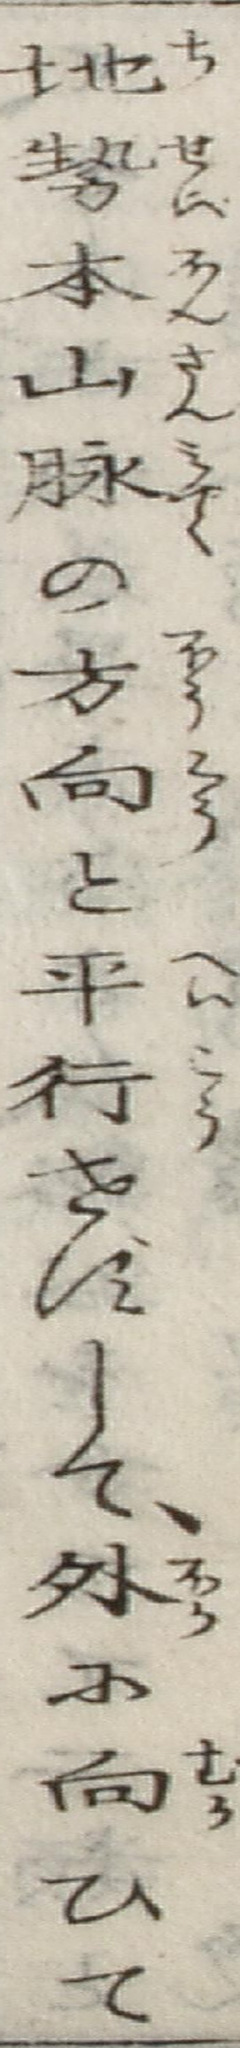地勢本山脈の方向と平行せすして、外に向ひて
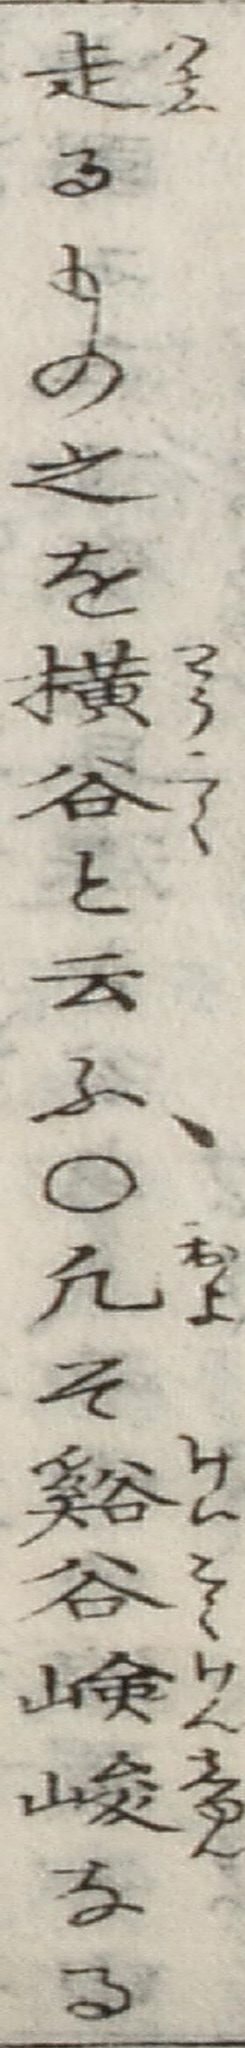走るもの之を横谷と云ふ、○凡そ渓谷𡸴峻なる
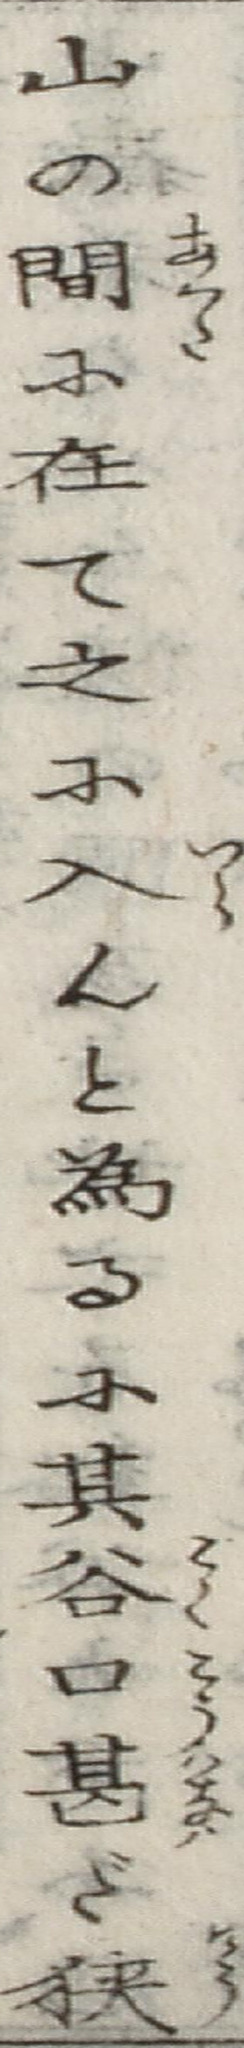山の間に在て之に入んと為るに其谷口甚だ狭
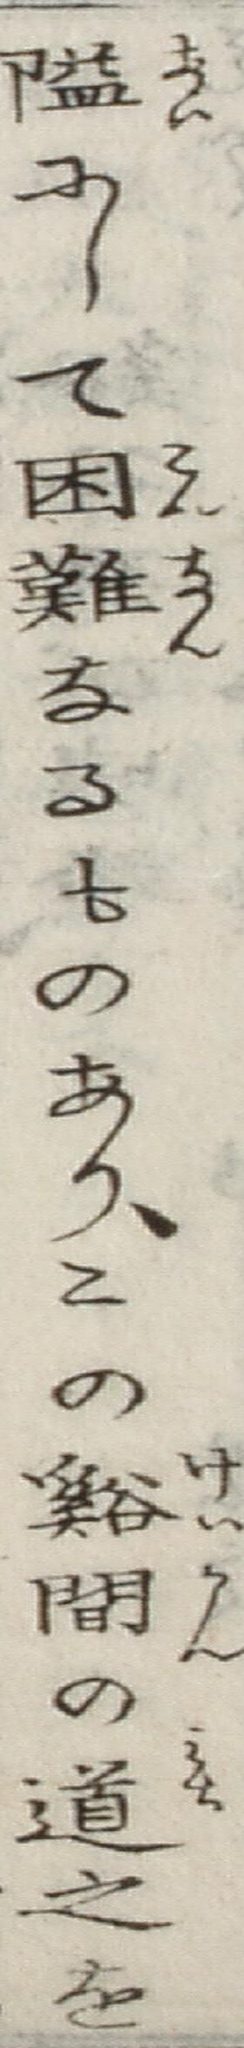険にして困難なるものあり、この渓間の道之を
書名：訓蒙　天然地理學　上
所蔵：東京大学地震研究所図書室 Earthquake Research Institute Library, The University of Tokyo, JAPAN
